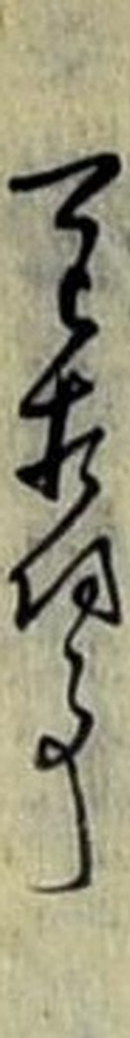可被相伺事
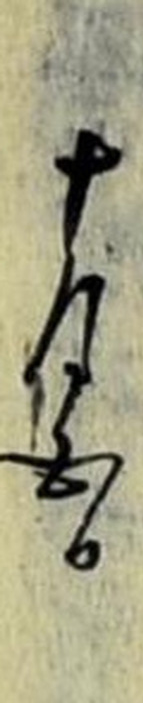十月五日

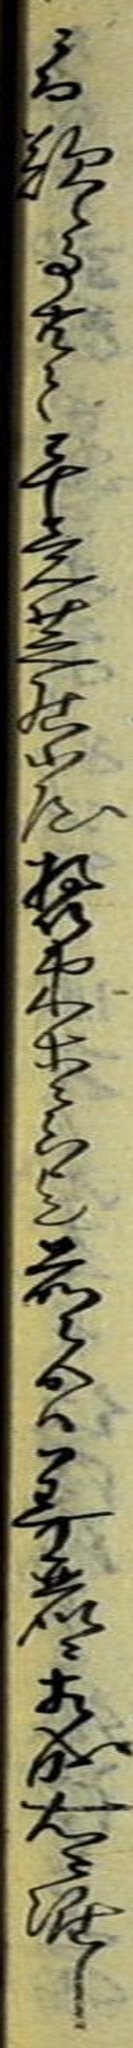ニ而歎候事共ニ候畢竟芝居小屋束等ニ至迄前々ゟハ華麗ニ相成右ニ准し
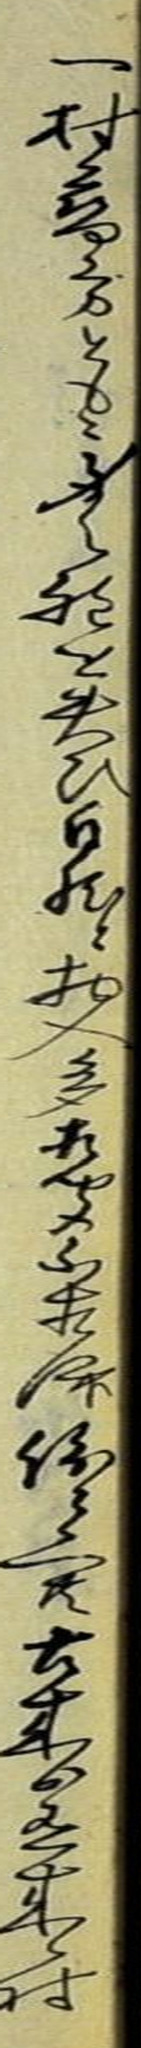一村暮方ともニ見之程を失ひ自然と物入多相聞不相済儀ニ候へ共古来ゟ有来候村

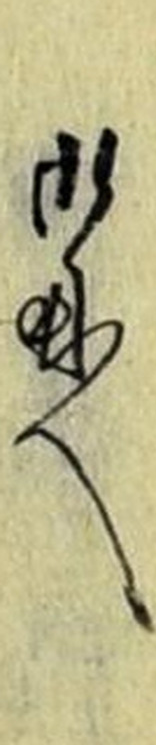御用人
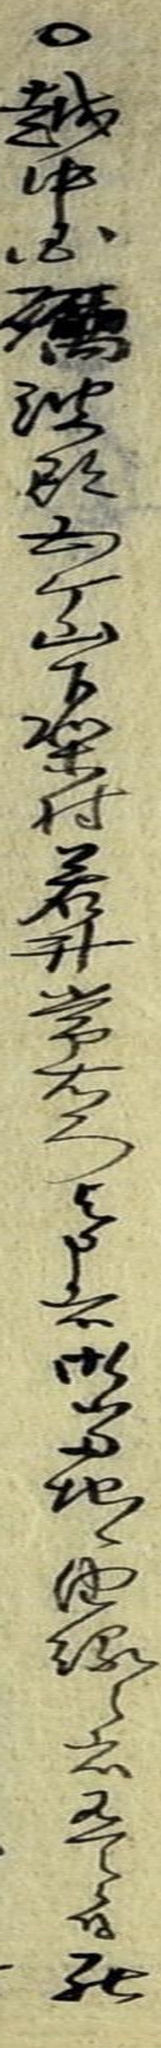〇越中国砺波郡五ケ山下梨村若井常右衛門与申者御当地へ由縁之者有之ニ付罷
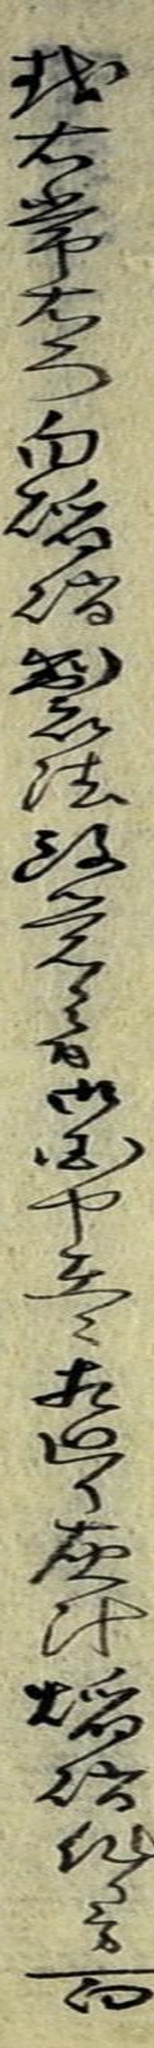越右常右衛門白焔硝製法致覚候ニ付御国中在々相廻り灰汁焔硝作り方百
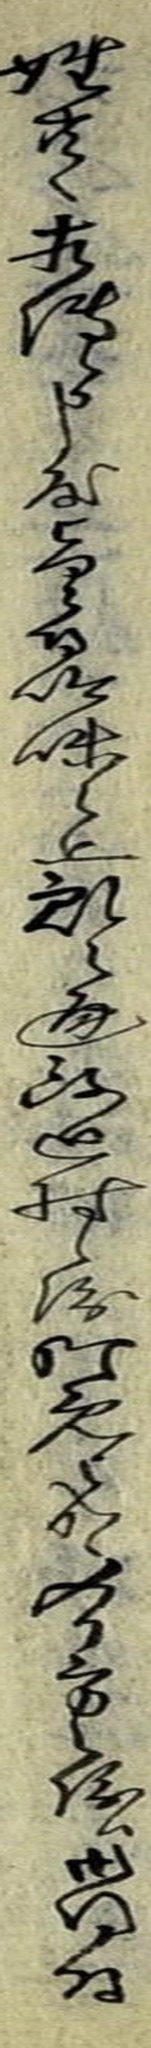姓共へ相伝へ申度旨ニ付吟味之上願之通致廻村之儀御免被成候〆り方之儀ハ御目付
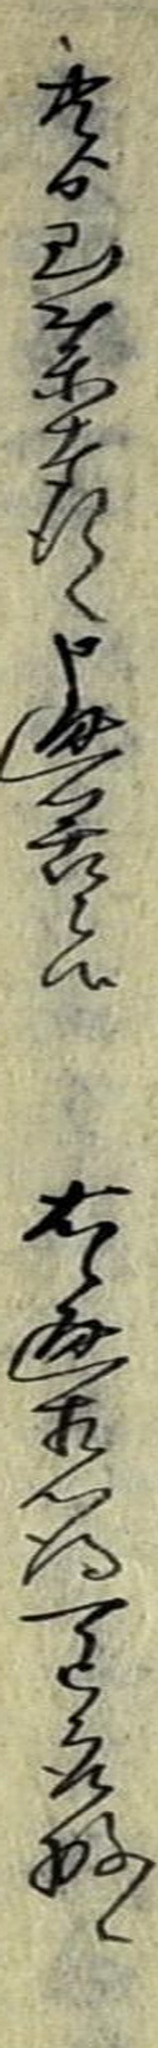共ゟ玉薬奉行へ申通筈ニ候右之通相心得可被取扱候
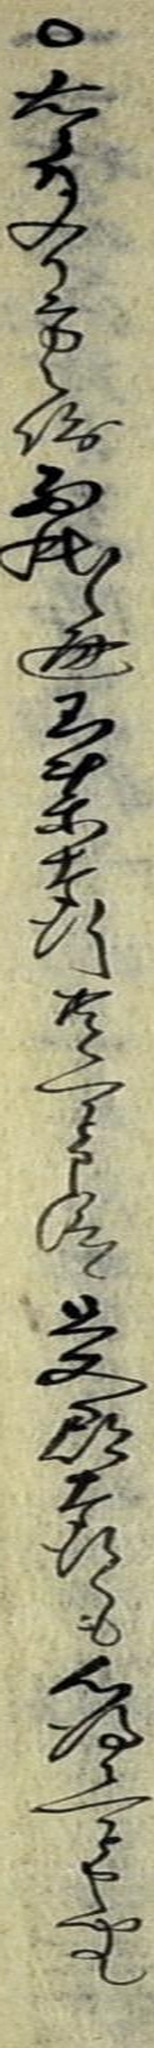〇右ニ付〆り方之儀別紙之通玉薬奉行共へ可被申渡候且又郡奉行へも心得ニ可被申聞候
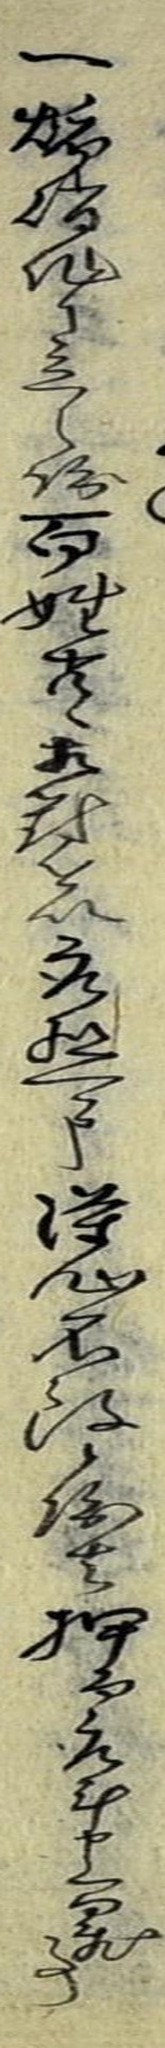一焔硝作り立之儀百姓共へ相対を以取組可申得心不致候儀者押而取計申間敷事
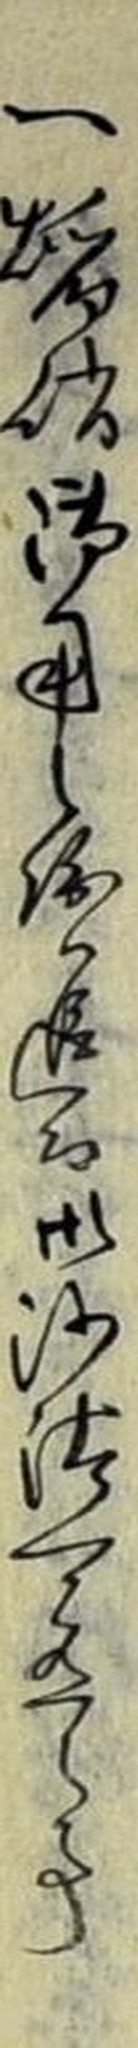一焔硝御用之儀ハ追而御沙汰可有之事
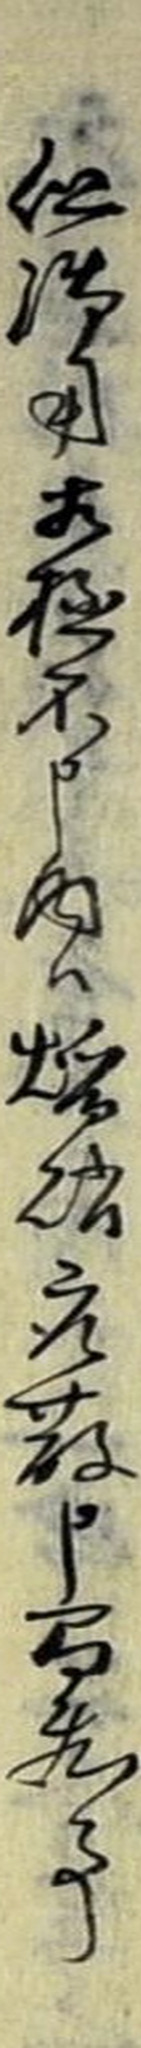但御用相極不申内ハ焔硝取散申間敷事
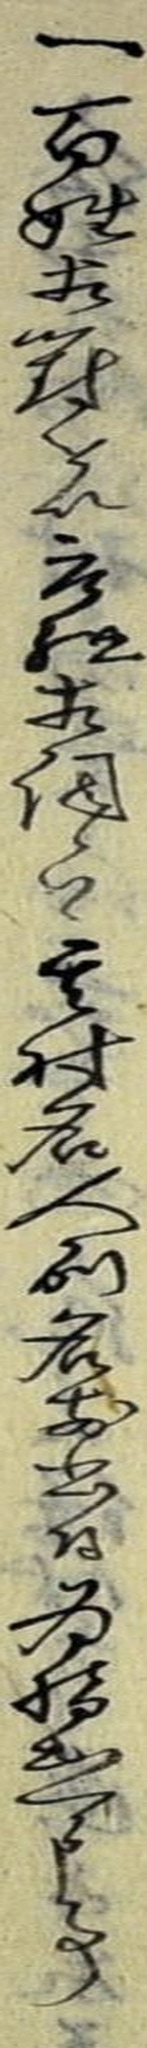一百姓相対を以取組相伺候ハヽ其村名人別名前書付為指出可申事
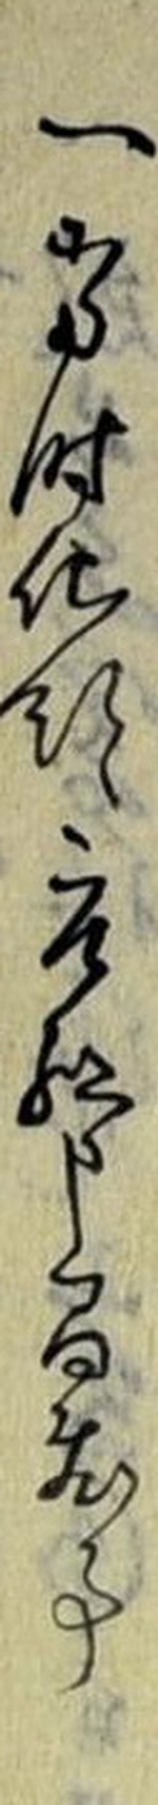一当時他領へ取組申間敷事
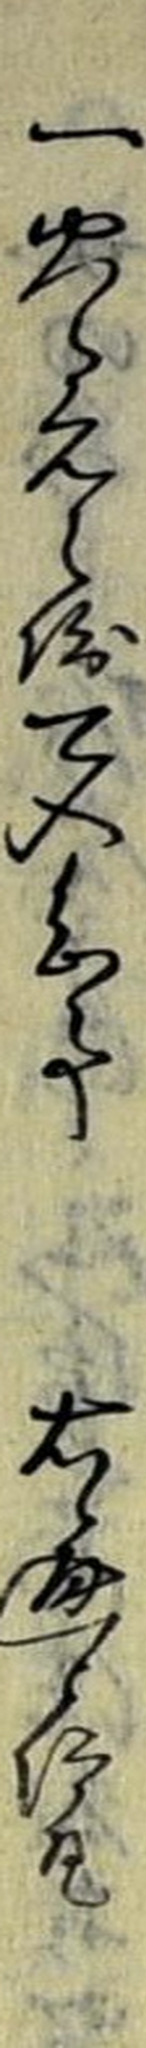一火之元之儀可入念事右之通被仰付候
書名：命令之部 三
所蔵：福井県文書館 Fukui Prefectural Archives
